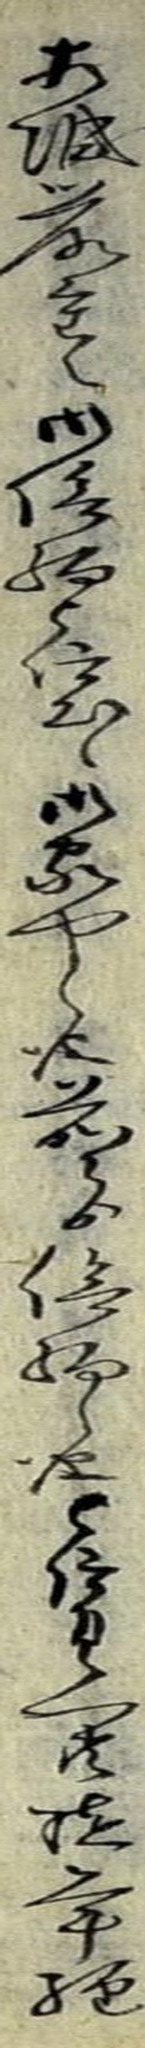相減厳重之御倹約被仰出候御家中之儀前々ゟ倹約之儀被仰付候へ共随年経
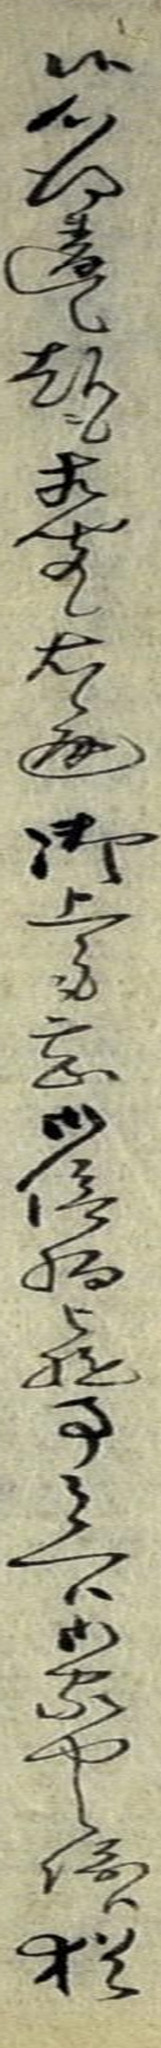候心得違之趣も相聞候右之通御上にも甚御倹約被遊事に候へは御家中之儀は猶
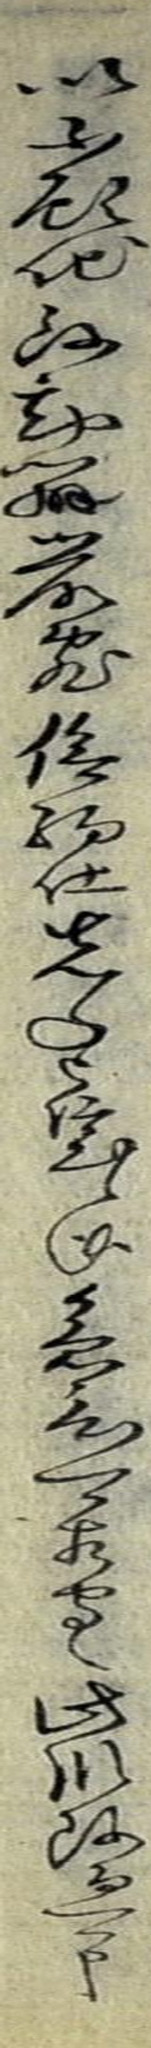以不顧他致勘弁厳敷倹約仕先年被仰出候趣急度可相守候此段改而可申
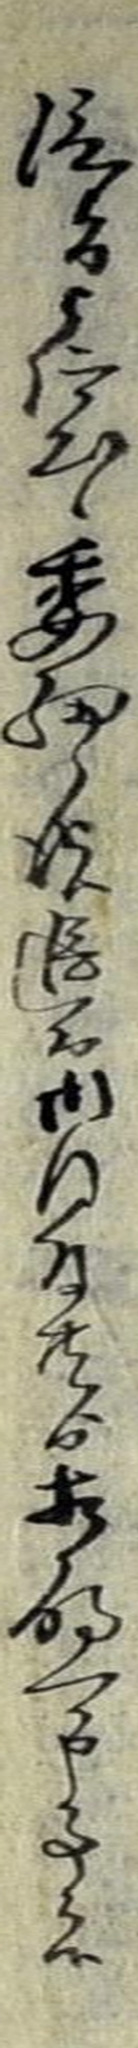渡旨被仰出候委細之儀は追而御目付共ゟ相触可申事に候
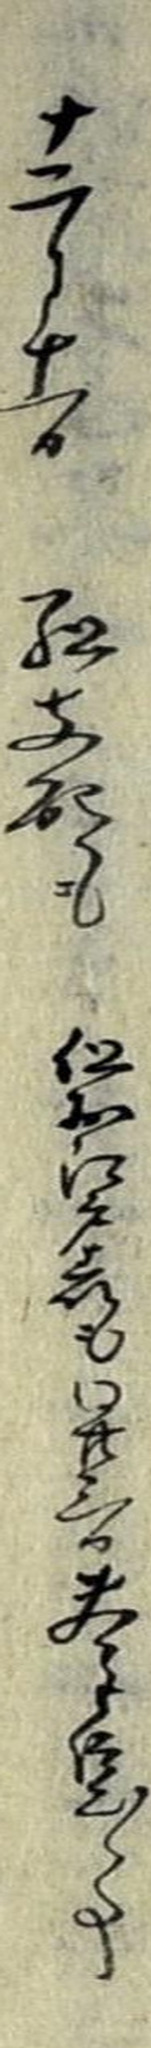十二月十一日組支配へも但於江戸表も同廿三日夫々被仰出候事
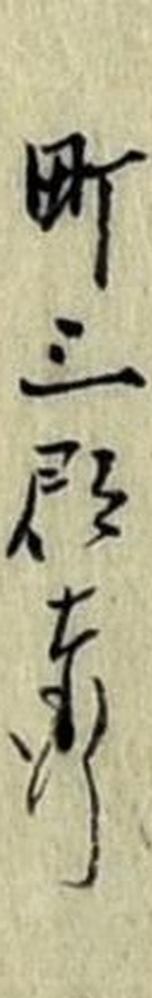町三郡奉行
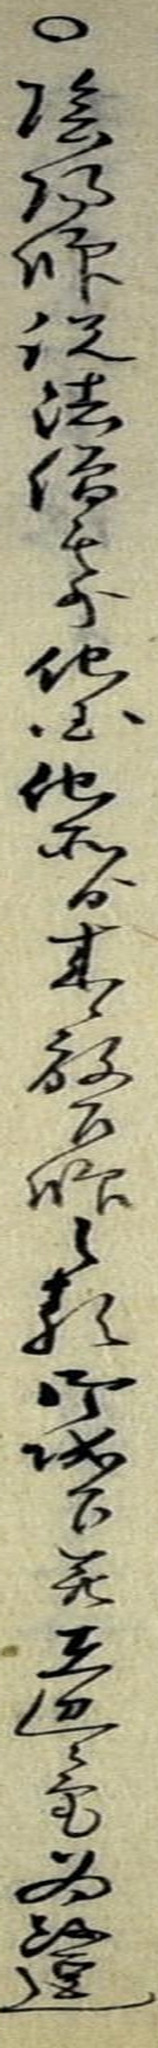〇陰陽師説法僧其外他国他所ゟ来候放下師之類御城下并在辺に而も為致逗
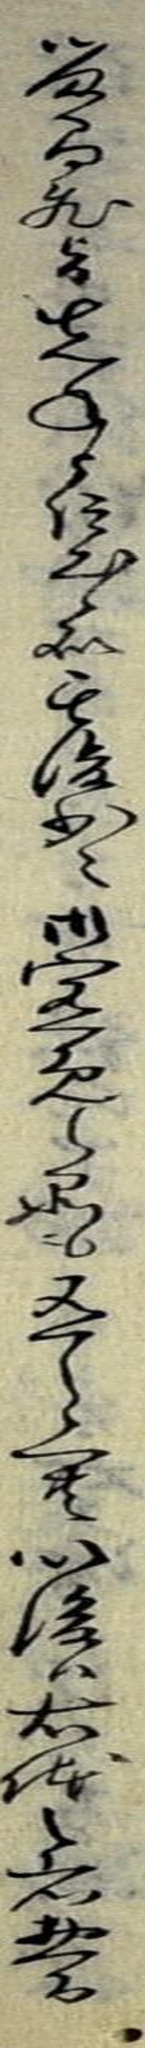留間敷旨先年被仰出候処其後少々御宥免之品も有之候へ共以後は右体之者惣而
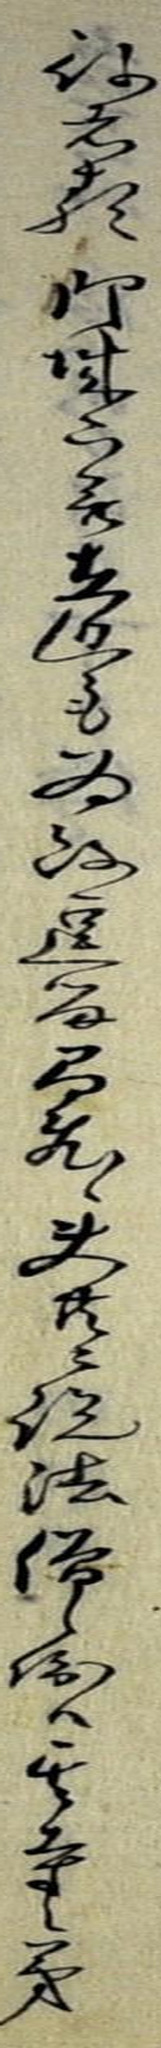役者類御城下并在辺にも為逗留間敷候夫共に説法僧之儀は其寺之弟
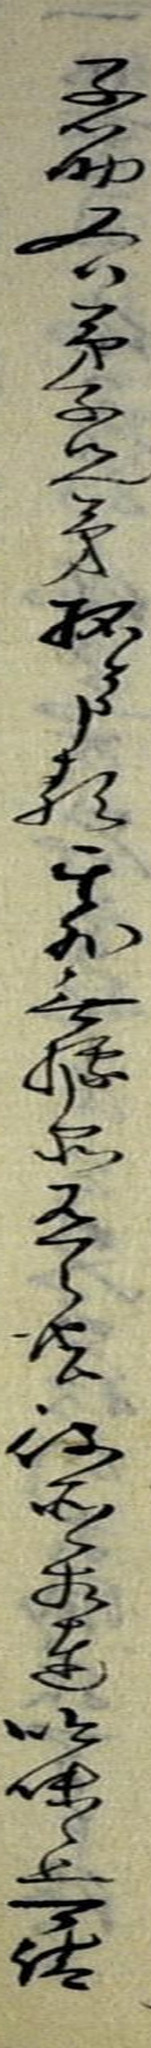子筋又は弟子兄弟抔と申類其外無拠品有之儀は役所へ相達吟味之上可請
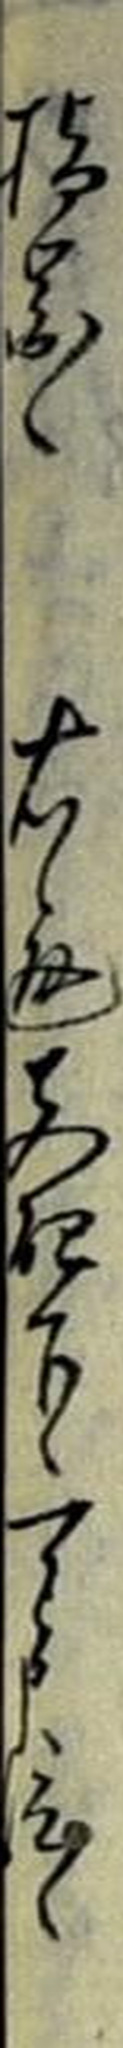指図候右之通支配下へ可被申渡候
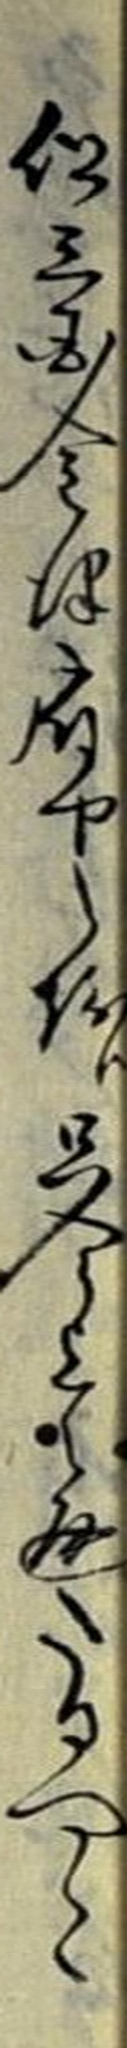但三国金津府中之儀は只今迄之通たるへく候
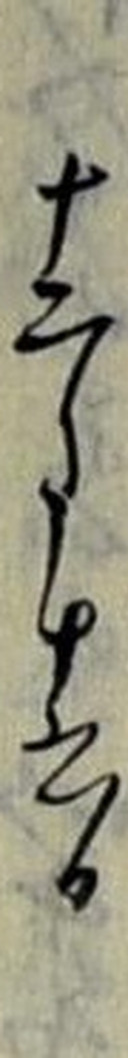十二月十六日
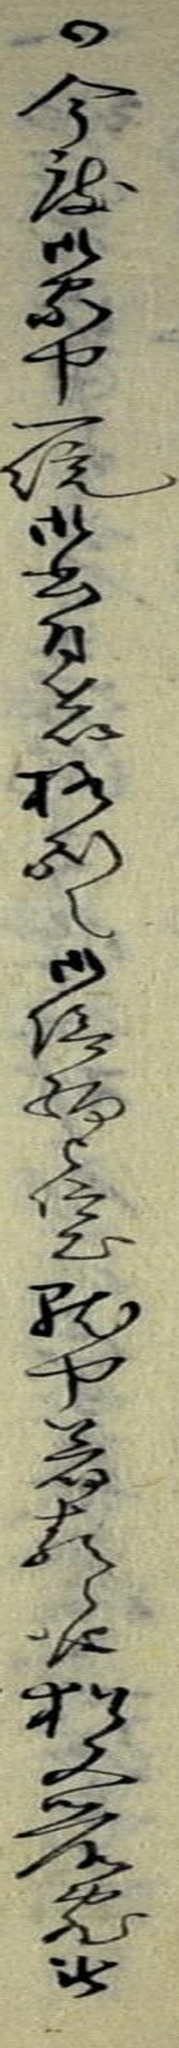〇今度御家中一統御書付を以格別之御倹約被仰出就中着類之儀猶又厳敷被
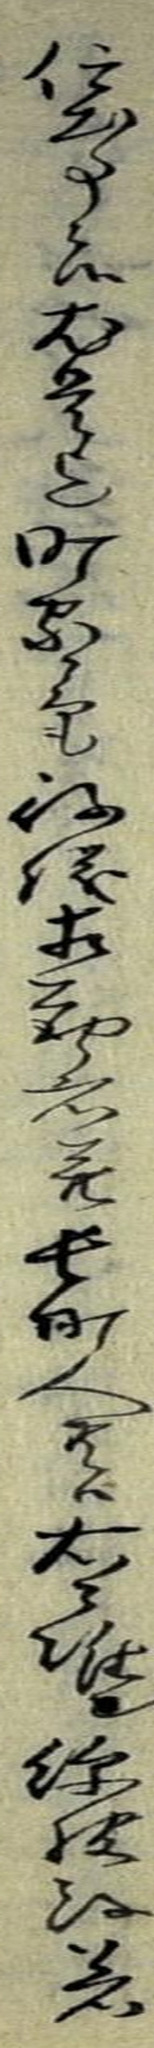仰出事に候尤是迄町家に而も役儀相勤之者共長町人共は右に准し綿服致着
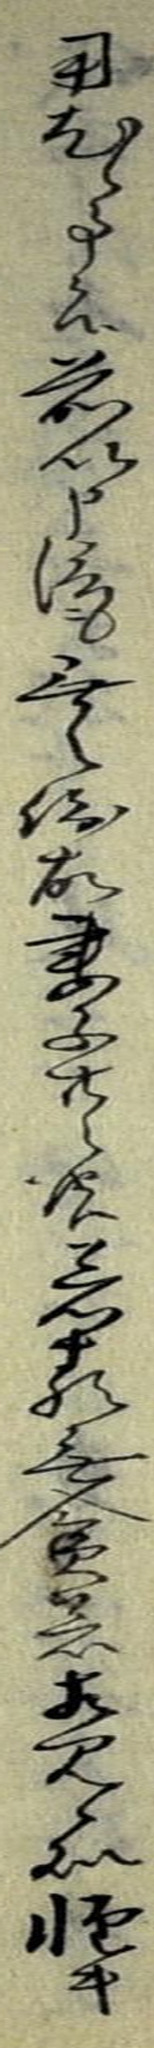用尤之事に候前以申渡も無之儀故妻子共之儀は着類無貪着相見候処軽き
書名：命令之部 二
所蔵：福井県文書館 Fukui Prefectural Archives
